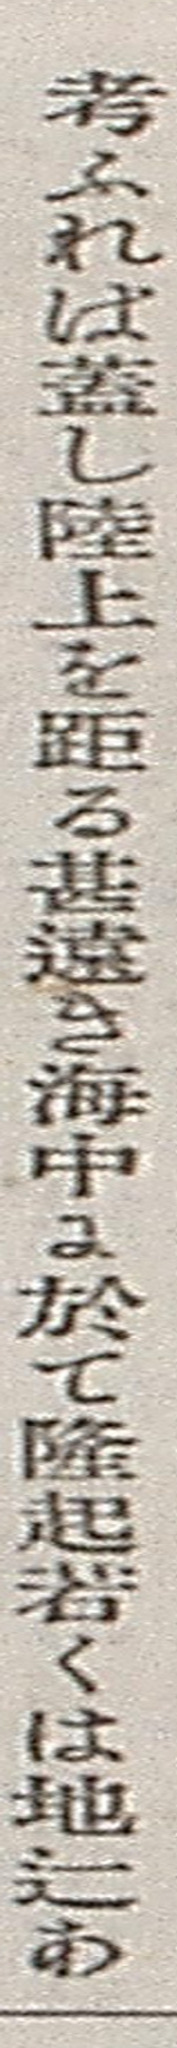考ふれば蓋し陸上を距る甚遠き海中に於て隆起若くは地辷あ
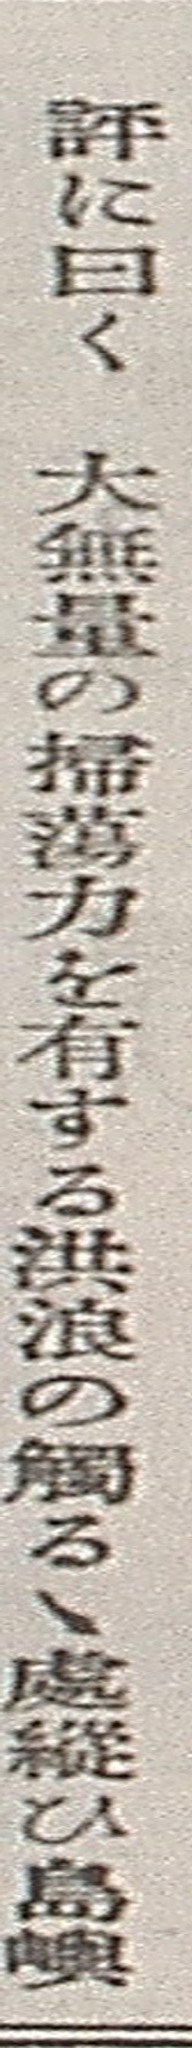評に曰く大無量の掃蕩力を有する洪浪の触るゝ処縦ひ島嶼
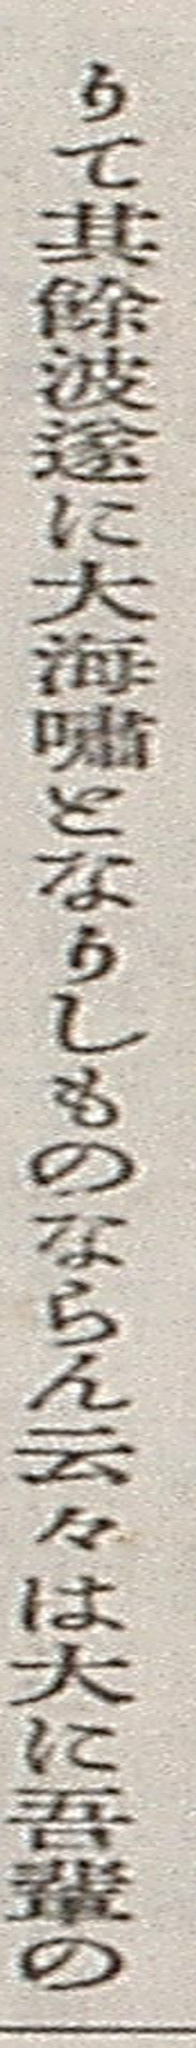りて其余波遂に大海嘯となりしものならん云々は大に吾輩の
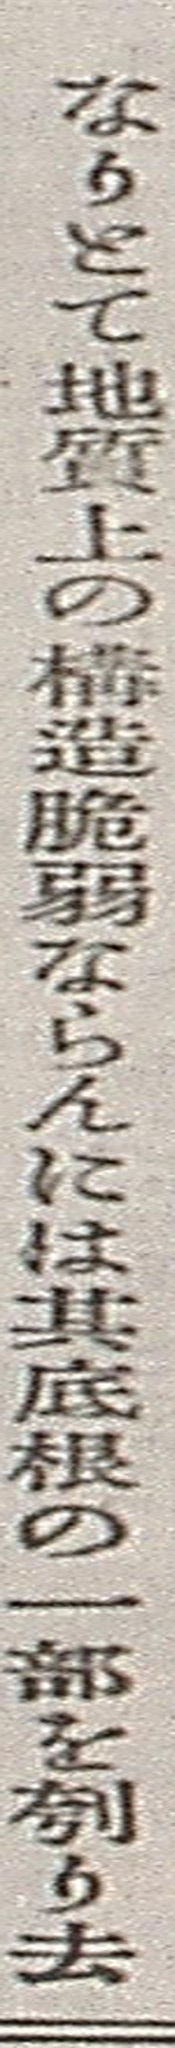なりとて地質上の構造脆弱ならんには其底根の一部を刳り去
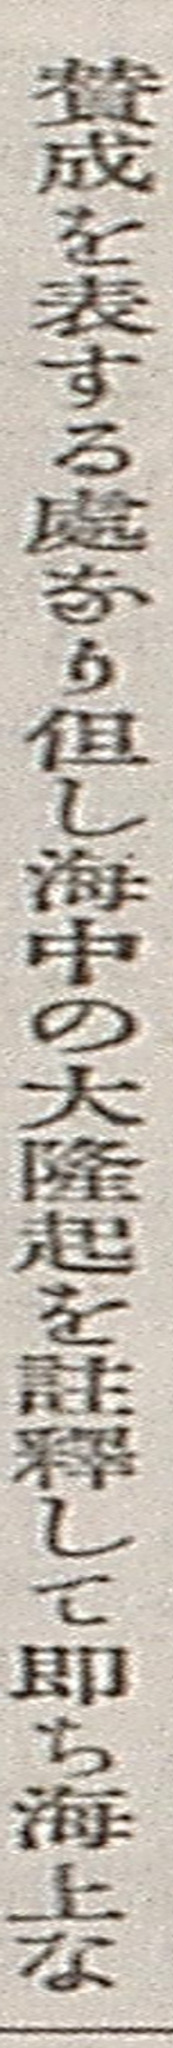賛成を表する処なり但し海中の大隆起を註釈して即ち海上な
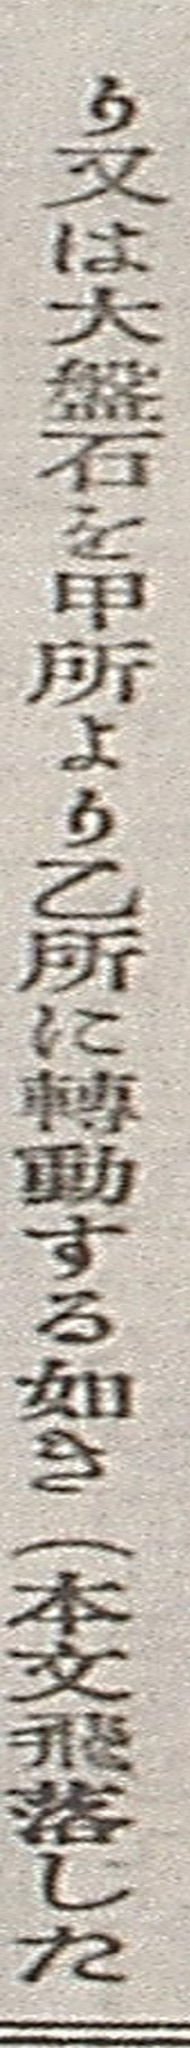り又は大磐石を甲所より乙所に転動する如き（本文飛落した
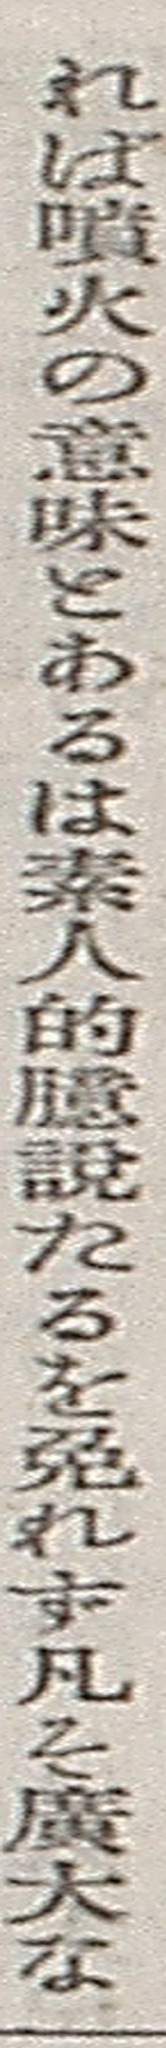れば噴火の意味とあるは素人的臆説たるを免れず凡そ広大な
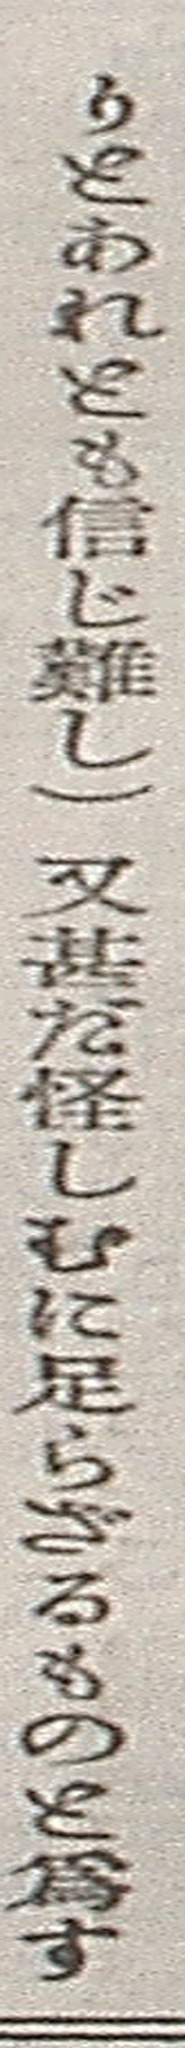りとあれとも信じ難し）又甚だ怪しむに足らざるものと為す
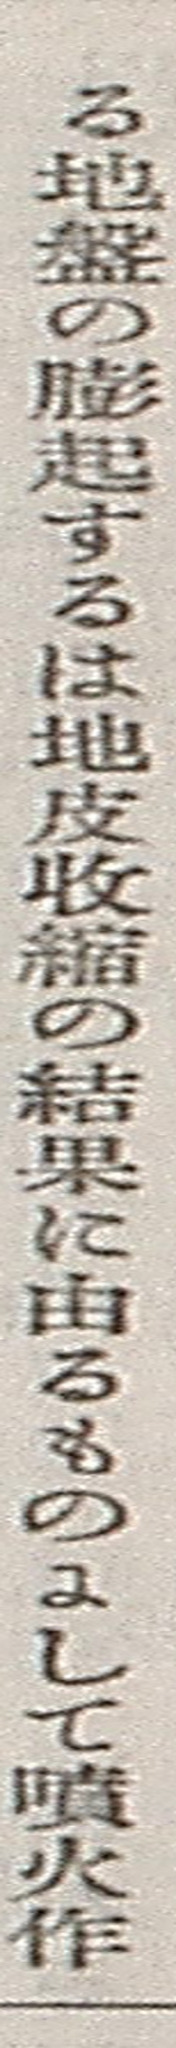る地盤の膨起するは地皮収縮の結果に由るものにして噴火作
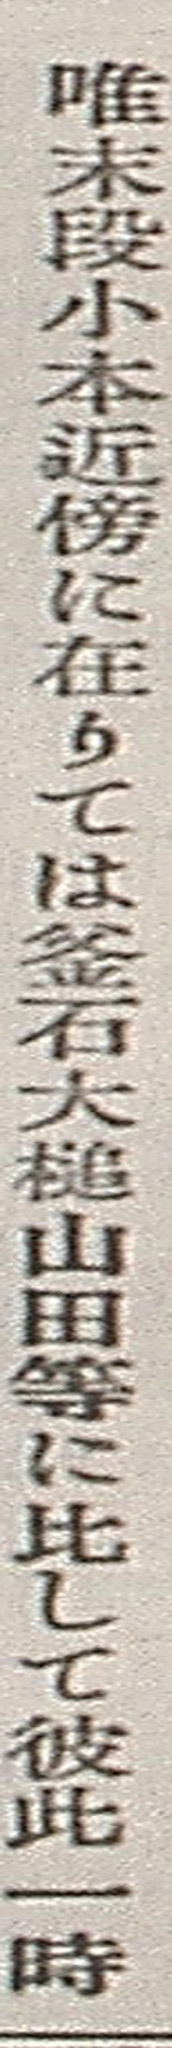唯末段小本近傍に在りては釜石大槌山田等に比して彼此一時
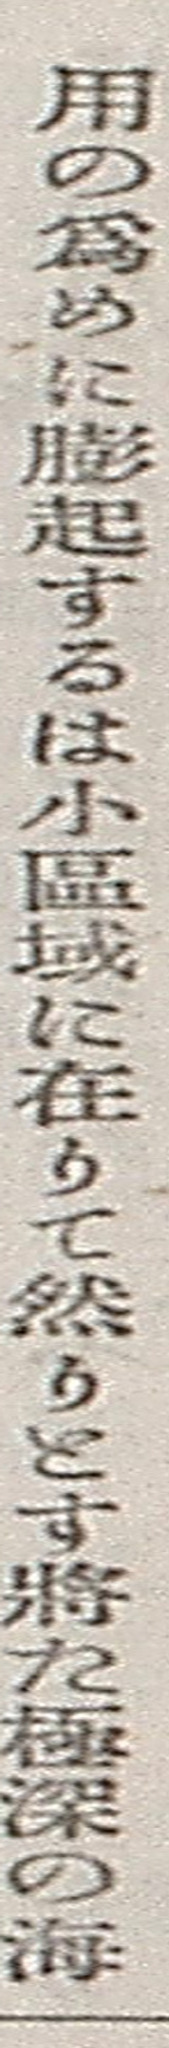用の為めに膨起するは小区域に在りて然りとす将た極深の海
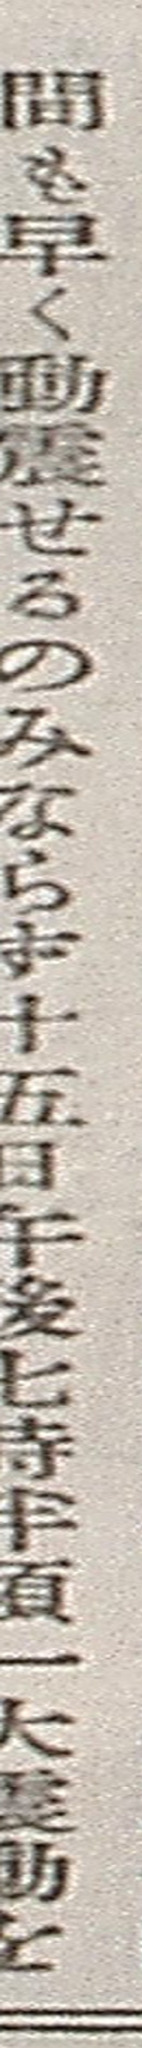間も早く動震せるのみならず十五日午後七時半頃一大震動を
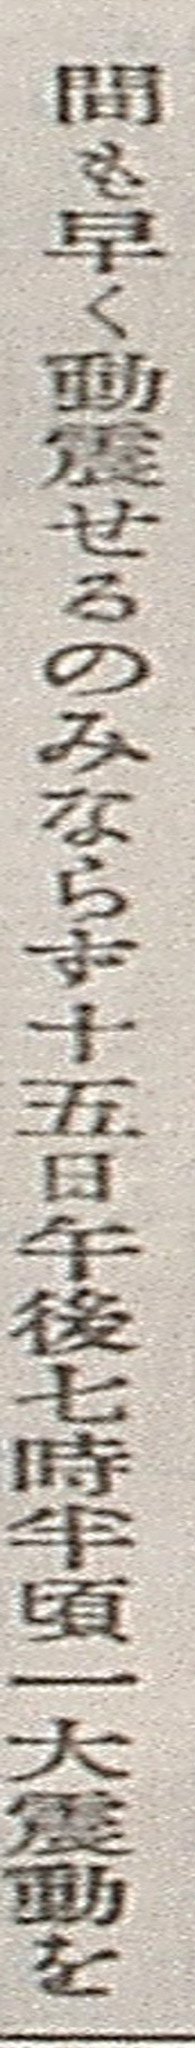間も早く動震せるのみならず十五日午後七時半頃一大震動を
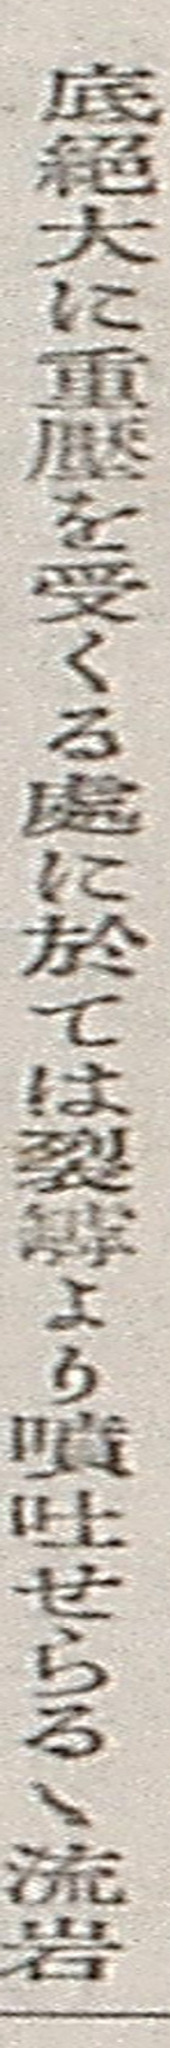底絶大に重圧を受くる処に於ては裂罅より噴吐せらるゝ流岩
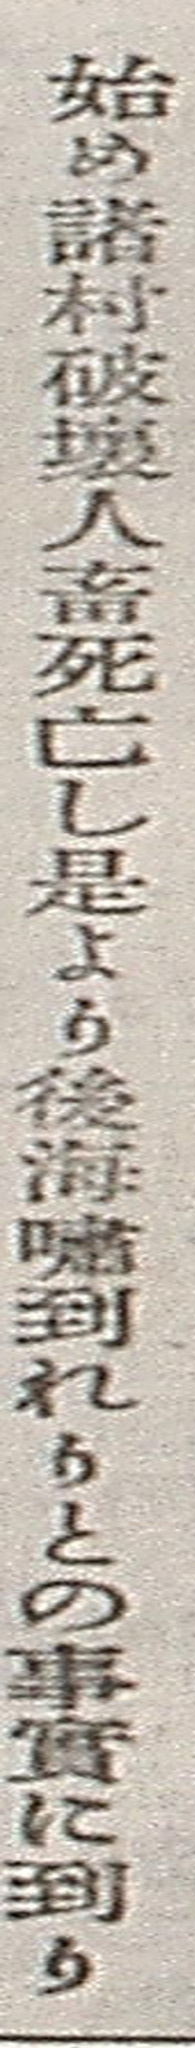始め諸村破壊人畜死亡し是より後海嘯到れりとの事実に到り
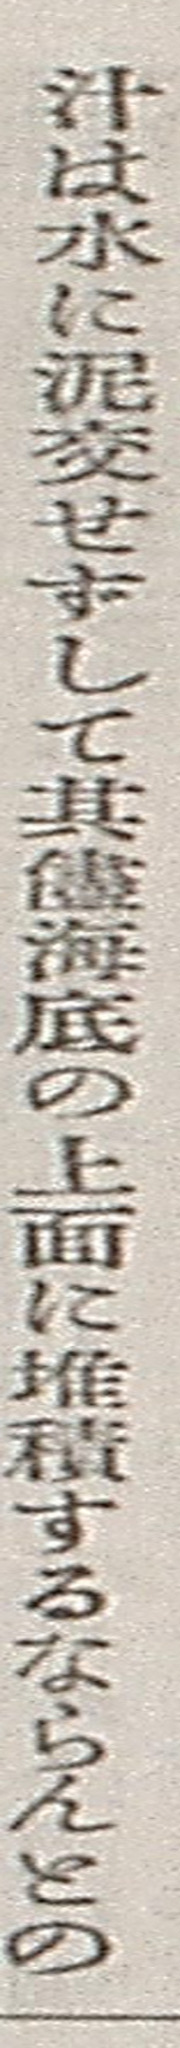汁は水に泥交せずして其侭海底の上面に堆積するならんとの
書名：風俗畫報臨時増刊第百十九號　大海嘯被害録（中）
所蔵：東京大学地震研究所図書室 Earthquake Research Institute Library, The University of Tokyo, JAPAN
